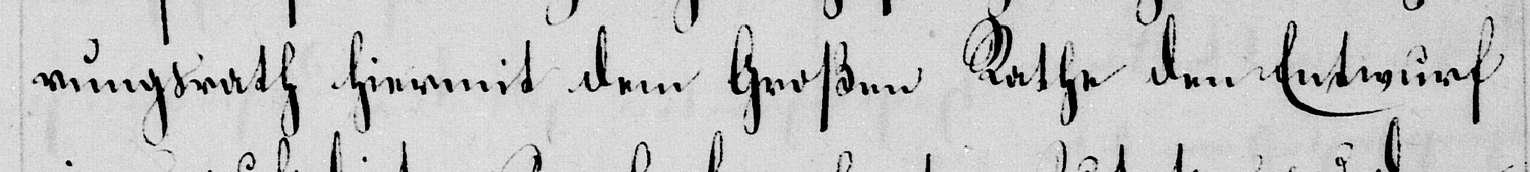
rungsrath hiermit dem Großen Rathe den Entwurf
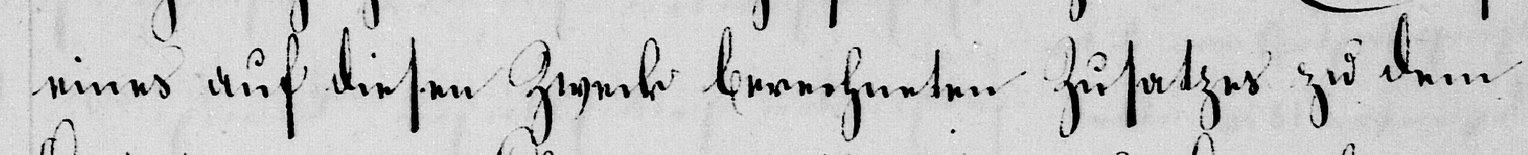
eines auf diesen Zweck berechneten Zusatzes zu dem
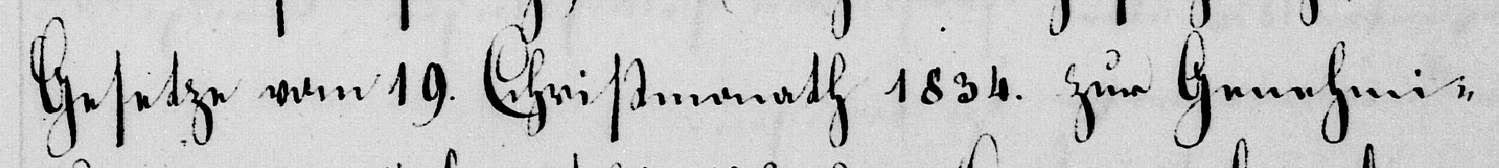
Gesetze vom 19. Christmonath 1834. zur Genehmi¬
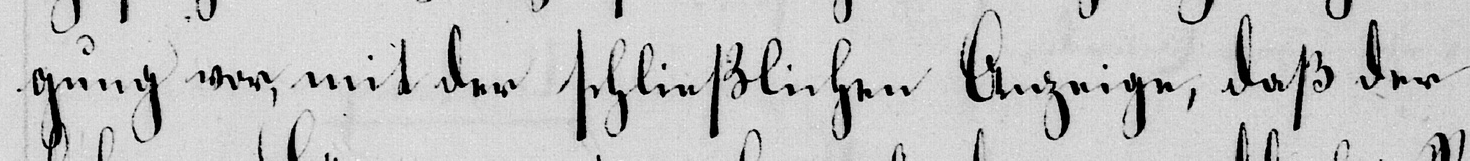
gung vor, mit der schließlichen Anzeige, daß der
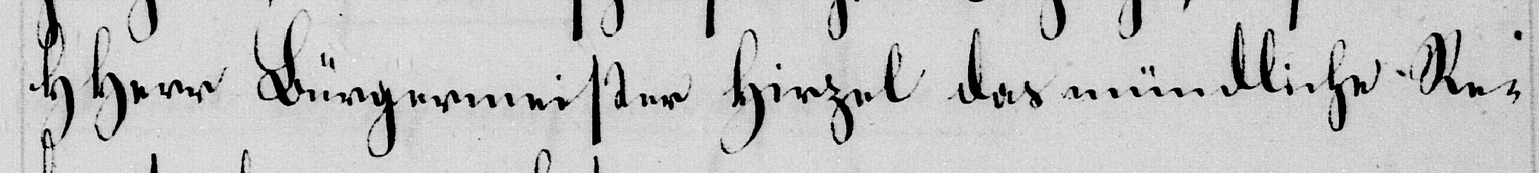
HHerr Bürgermeister Hirzel das mündliche Re¬
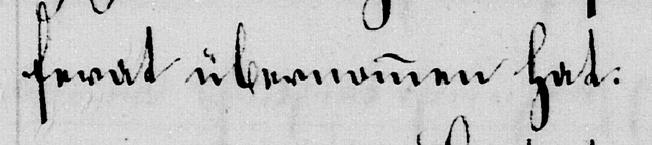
ferat übernommen hat.
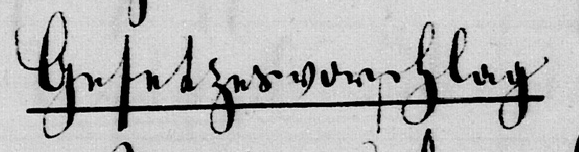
Gesetzesvorschlag
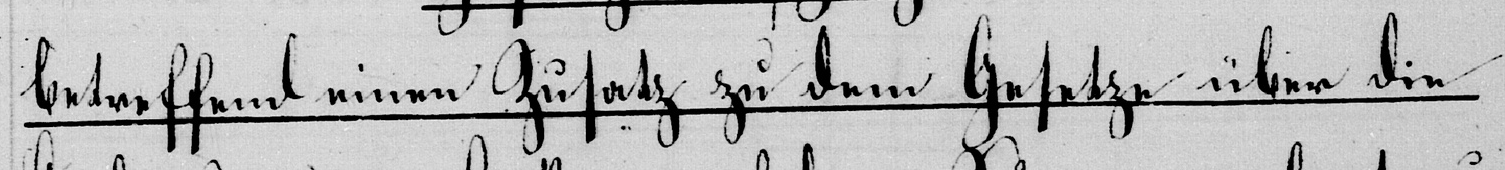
betreffend einen Zusatz zu dem Gesetze über die
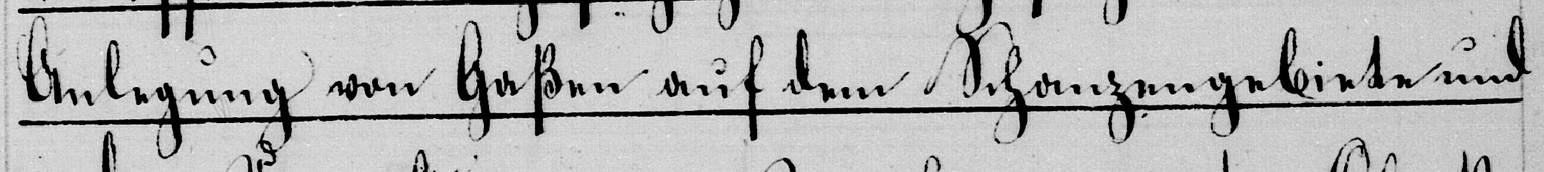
Anlegung von Gaßen auf dem Schanzengebiete und
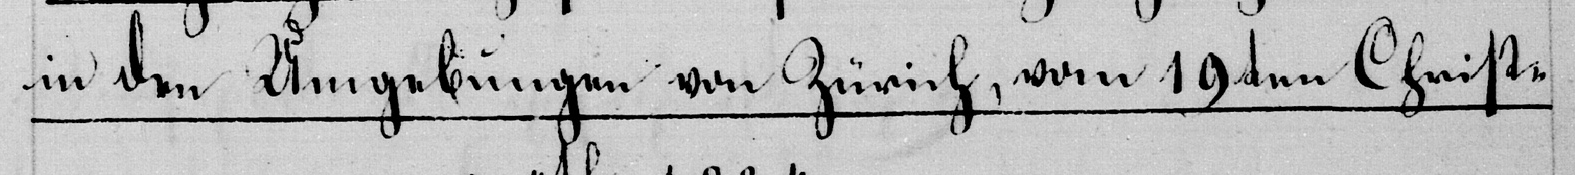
in den Umgebungen von Zürich, vom 19ten Christ¬
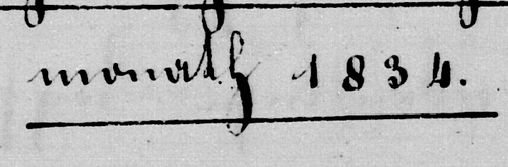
monath 1834.
